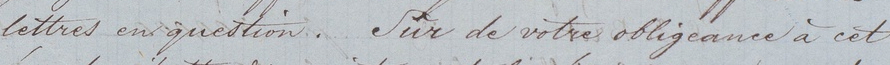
lettres en question. Sûr de votre obligeance à cet
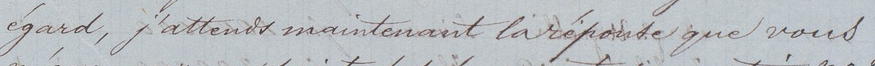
égard, j'attends maintenant la réponse que vous
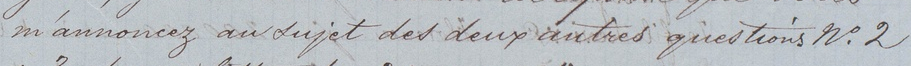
m'annoncez au sujet des deux autres questions No 2
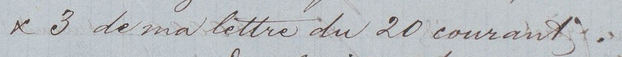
& 3 de ma lettre du 20 courant.
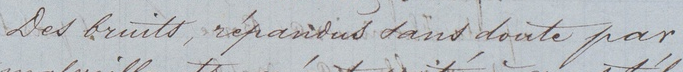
Des bruits, répandus sans doute par
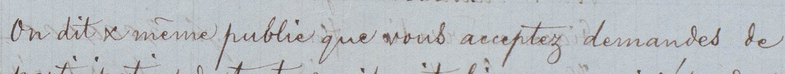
«On dit & même publie que vous acceptez demandes de
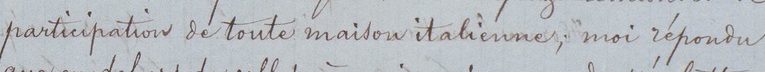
participation de toute maison italienne; moi répondu
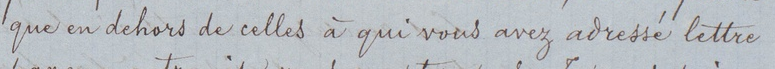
que en dehors de celles à qui vous avez adressé lettre
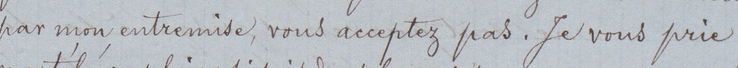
par mon entremise, vous acceptez pas. Je vous prie
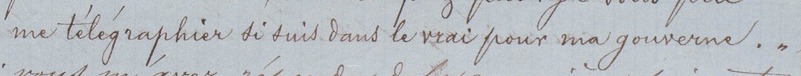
me télégraphier si suis dans le vrai pour ma gouverne.»
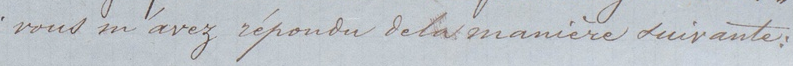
vous m'avez répondu de la manière suivante:
